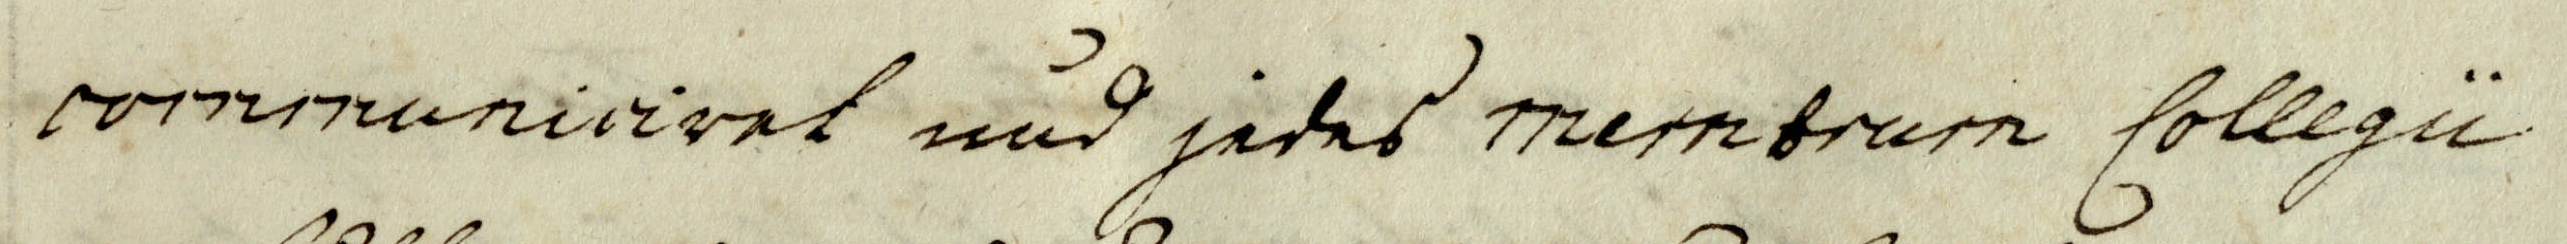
communiciret und jedes membrum Collegii
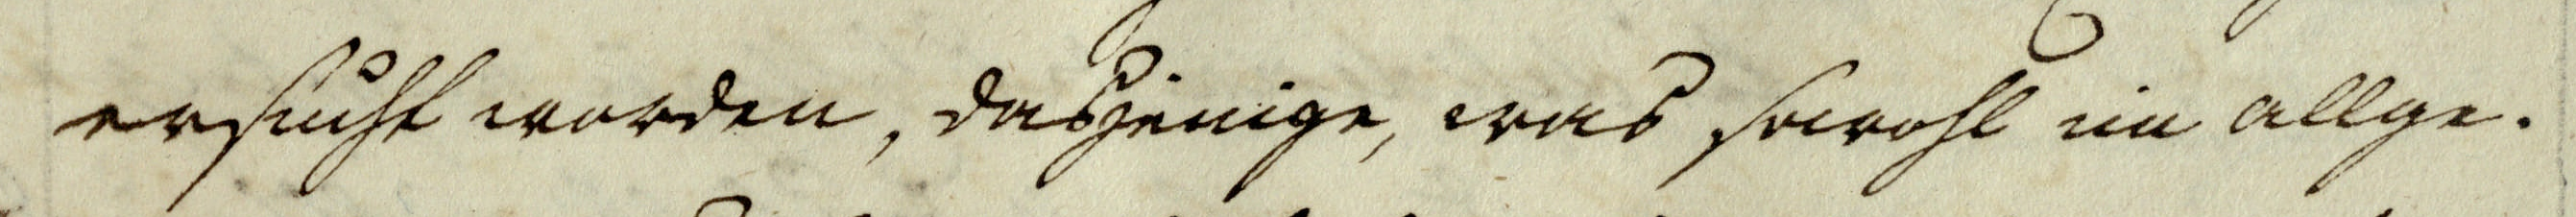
ersucht worden, dasjenige, was sowohl im allge¬
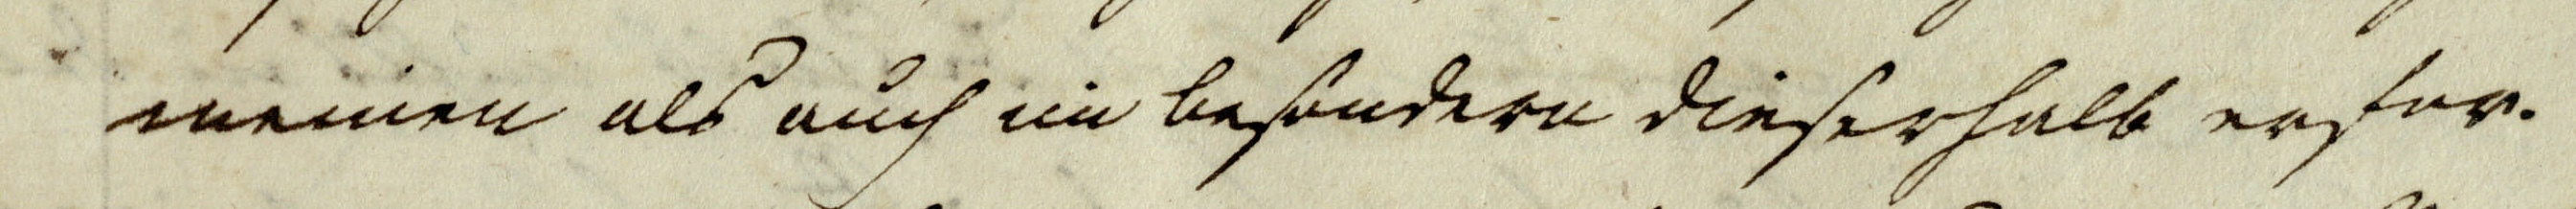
meinen als auch im besondern dieserhalb erfor¬
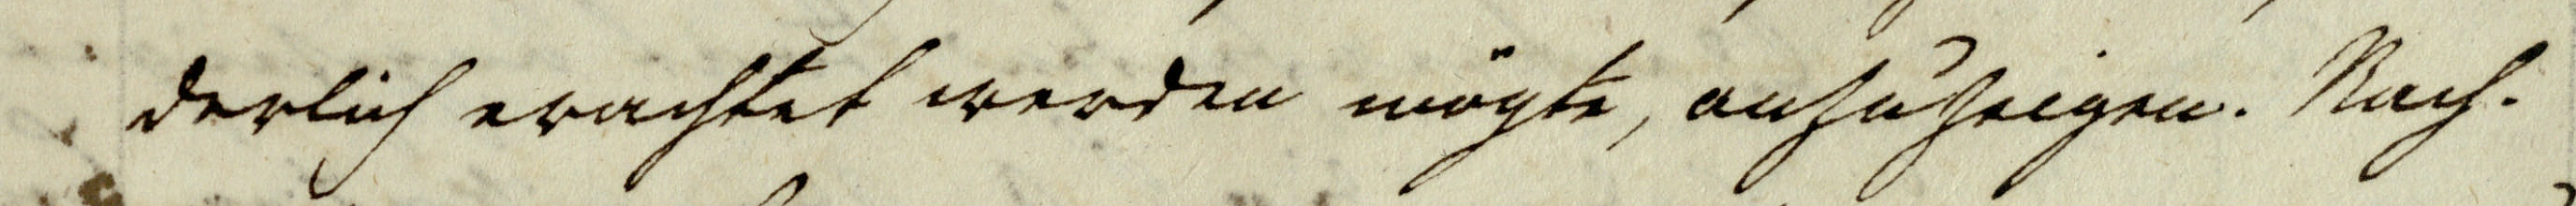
derlich erachtet werden möchte, aufzuzeigen. Nach¬
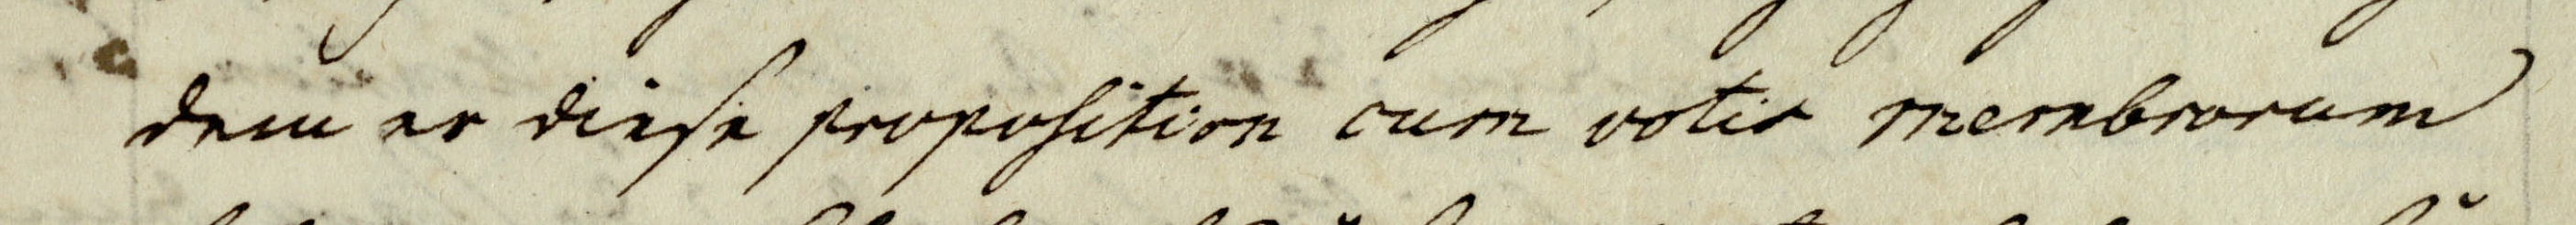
dem er diese proposition cum votis membrorum
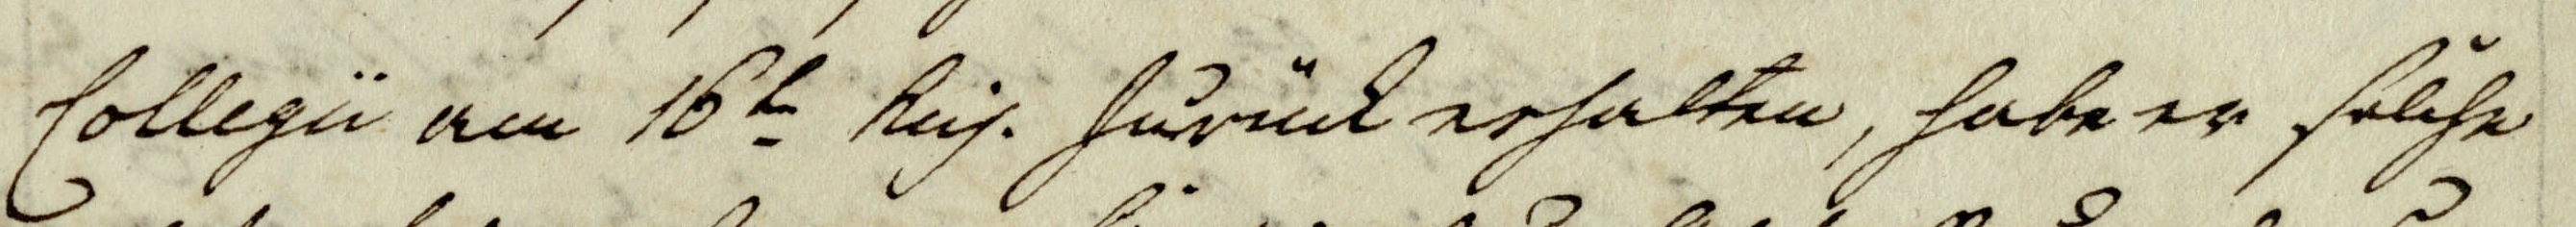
Collegii am 16t. huj. zurück erhalten, habe er solche
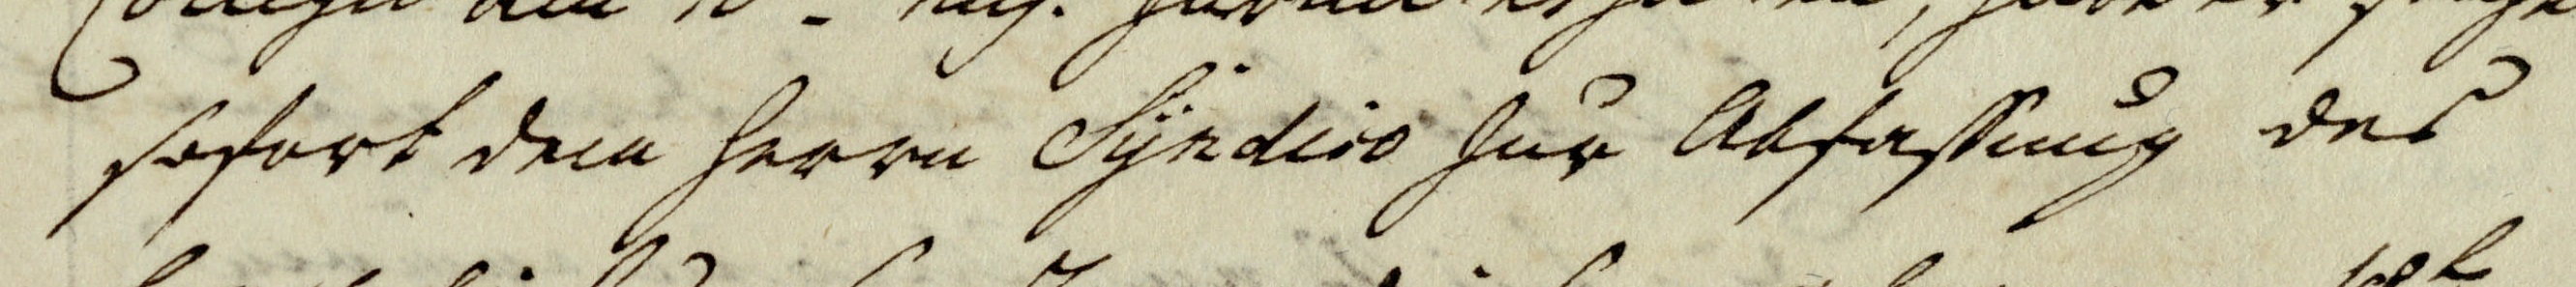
sofort dem Herrn Sÿndico zur Abfassung des
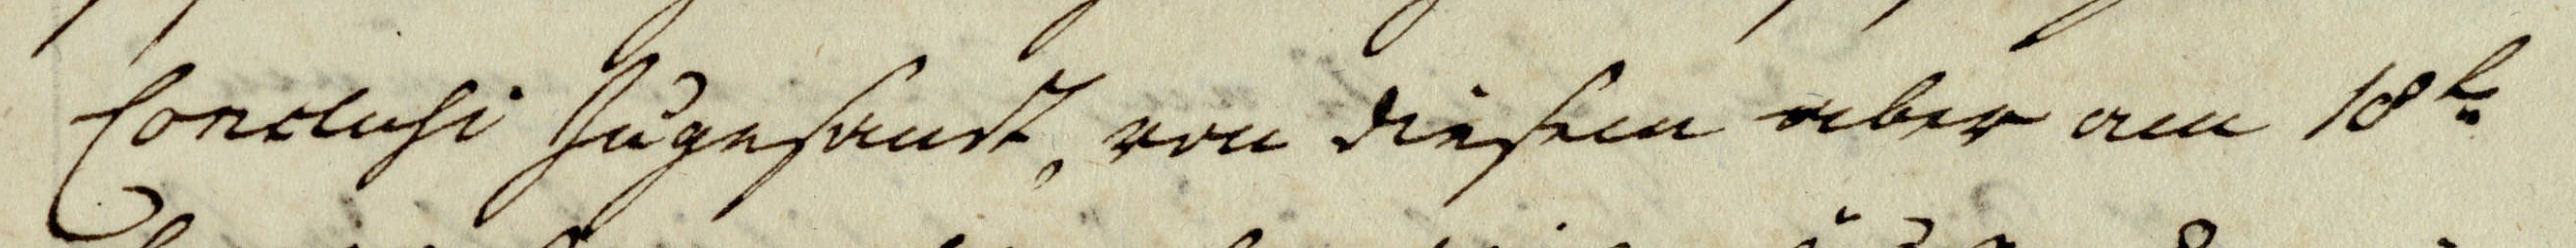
Conclusi zugesandt, von diesem aber am 18t.
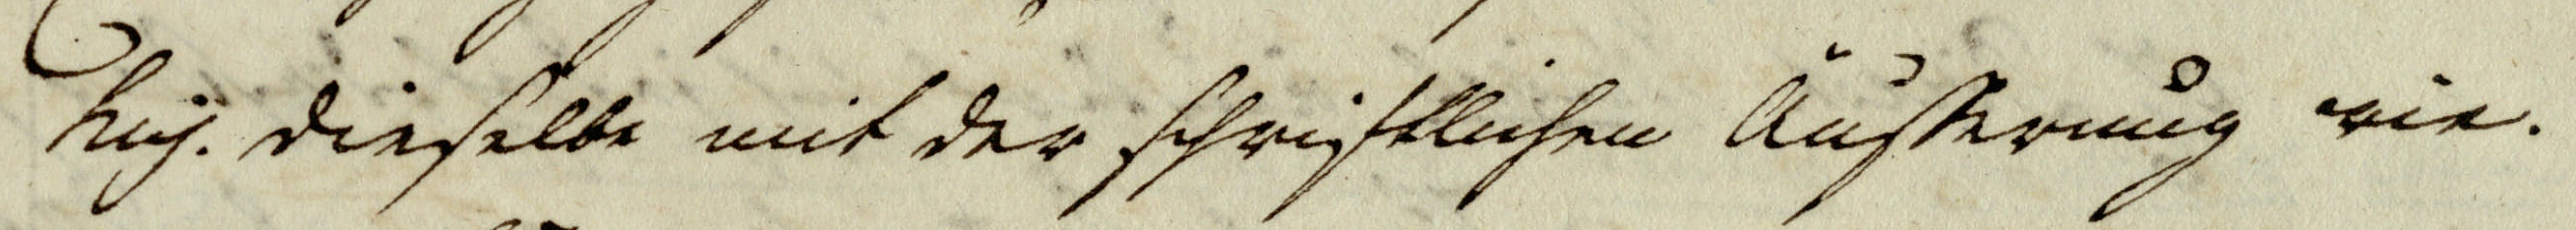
huj. dieselbe mit der schriftlichen Äusserung wie¬
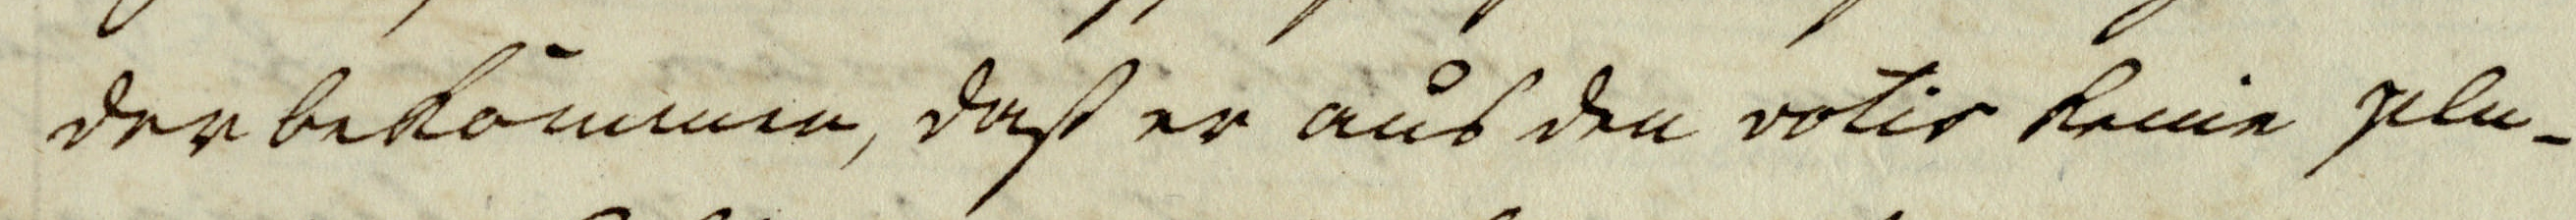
derbekommen, daß er aus den votis keine Plu¬
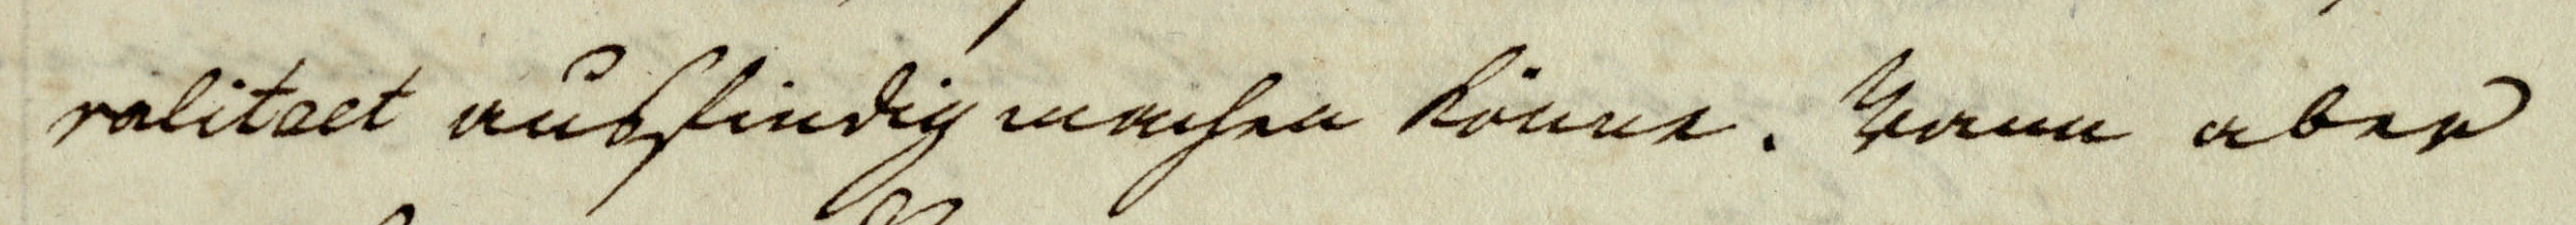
ralitaet ausfindig machen könne. Wann aber
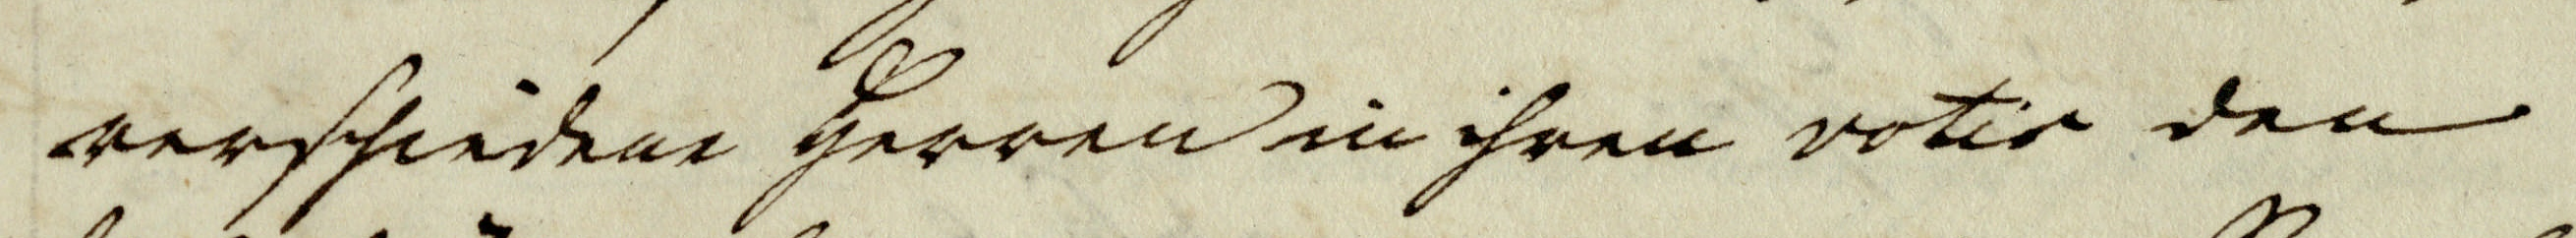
verschiedene Herren in ihren votis den
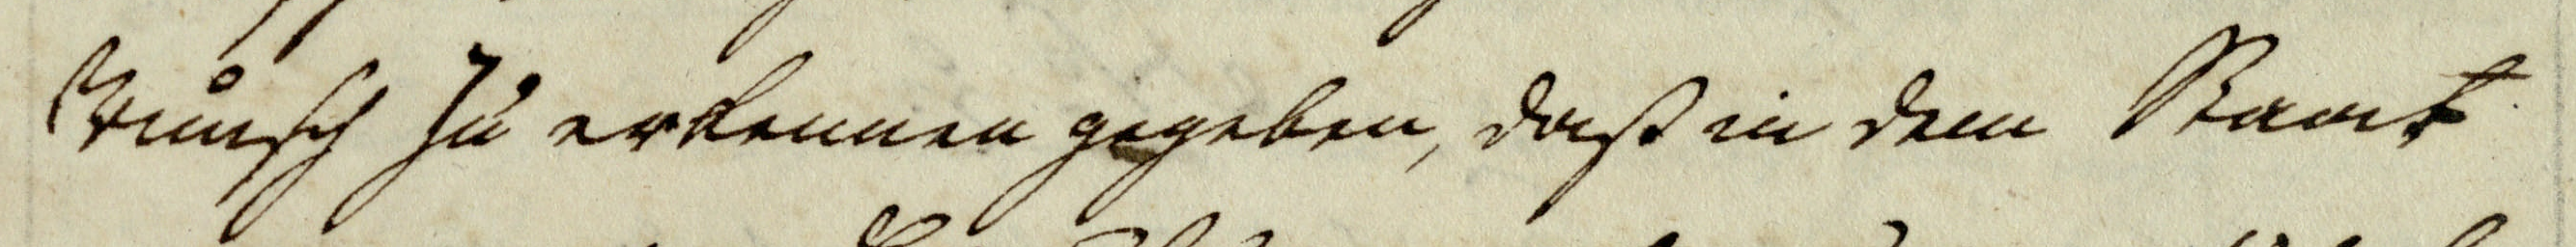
Wunsch zu erkennen gegeben, daß in dem Staat
